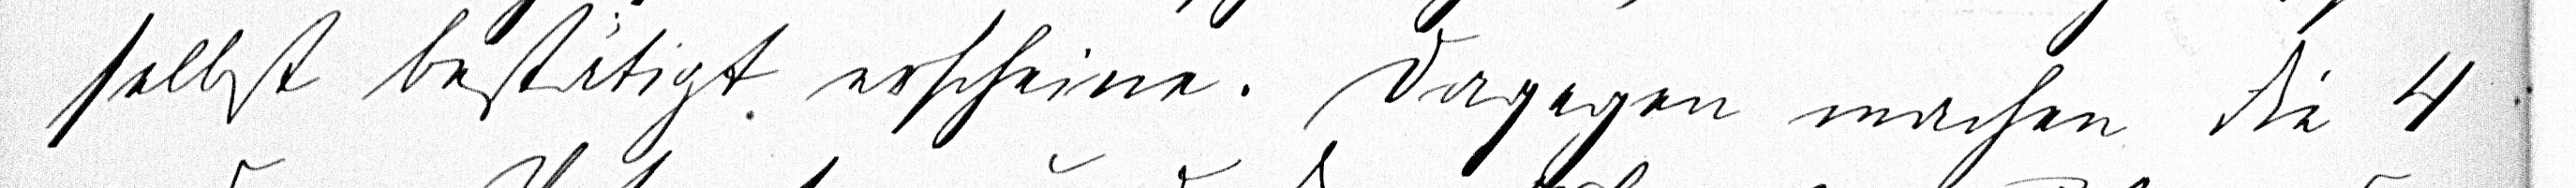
selbst bestätigt erscheine. Dagegen machen die 4
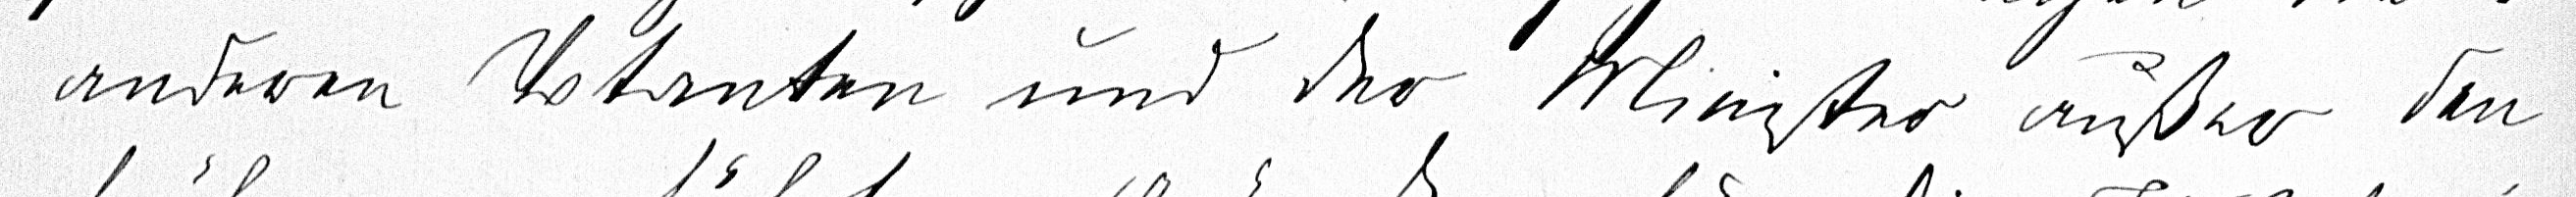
anderen Votanten und der Minister außer den
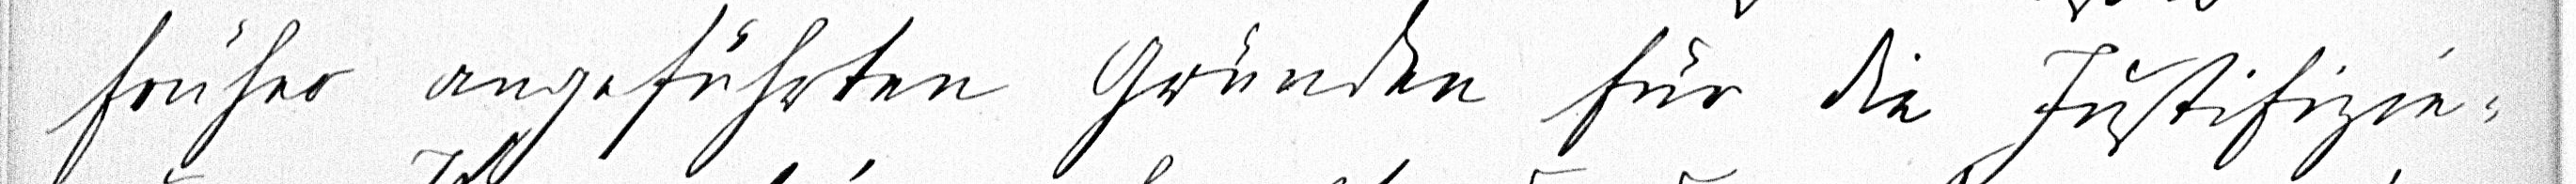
früher angeführten Gründen für die Justifizie¬
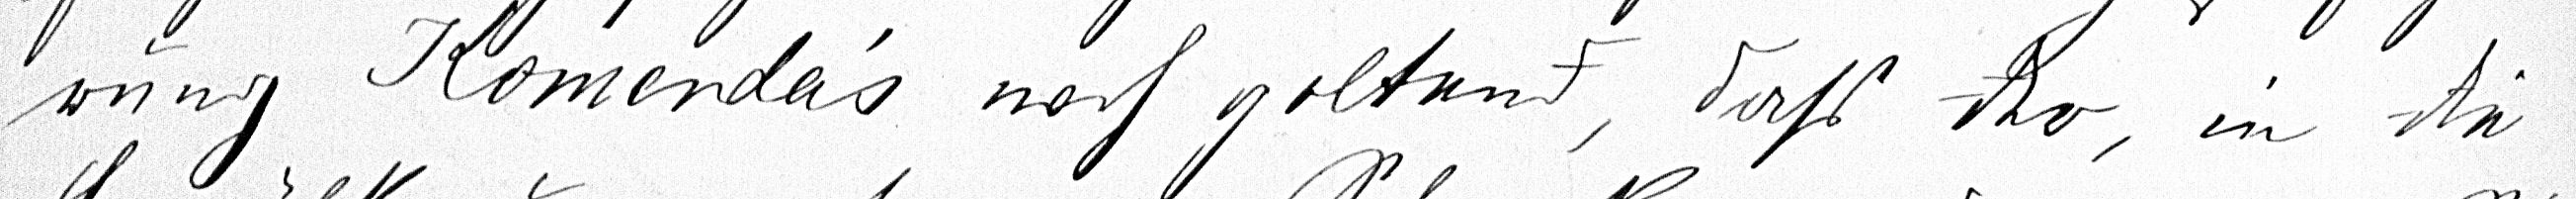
rung Komendás noch geltend, daß der, in die
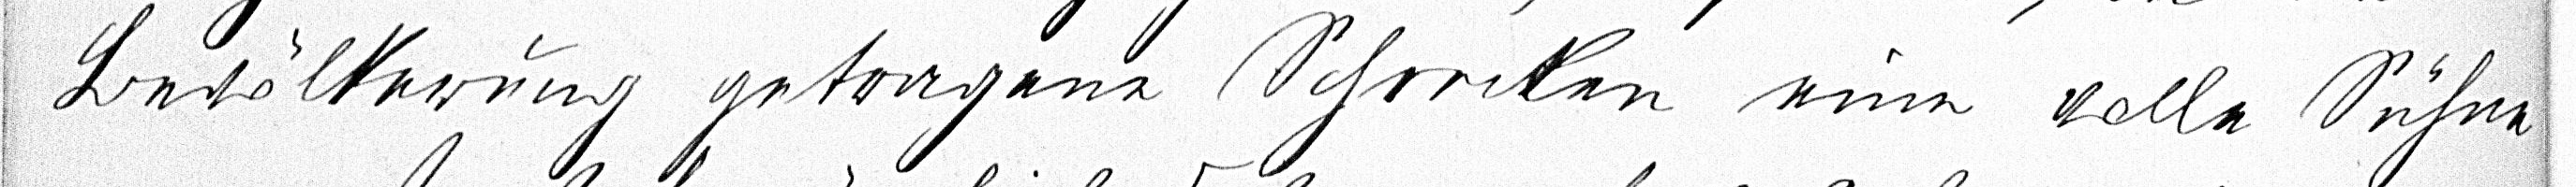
Bevölkerung getragene Schrecken eine volle sühne
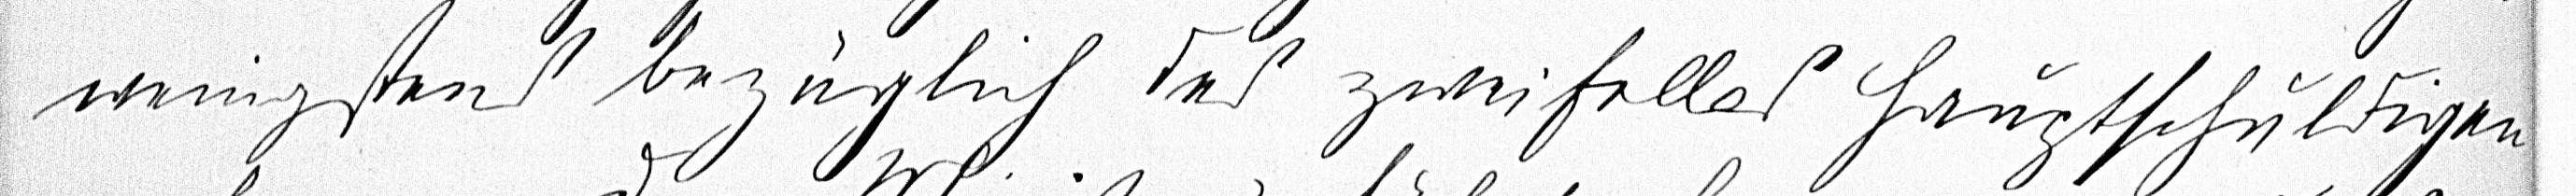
wenigstens bezüglich des zweifellos Hauptschuldigen
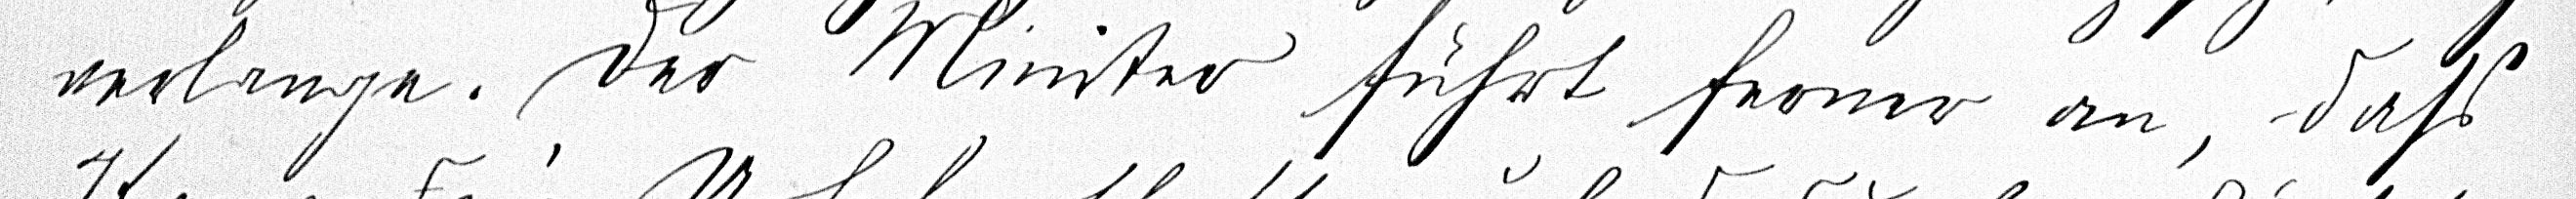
verlange. Der Minister führt ferner an, daß
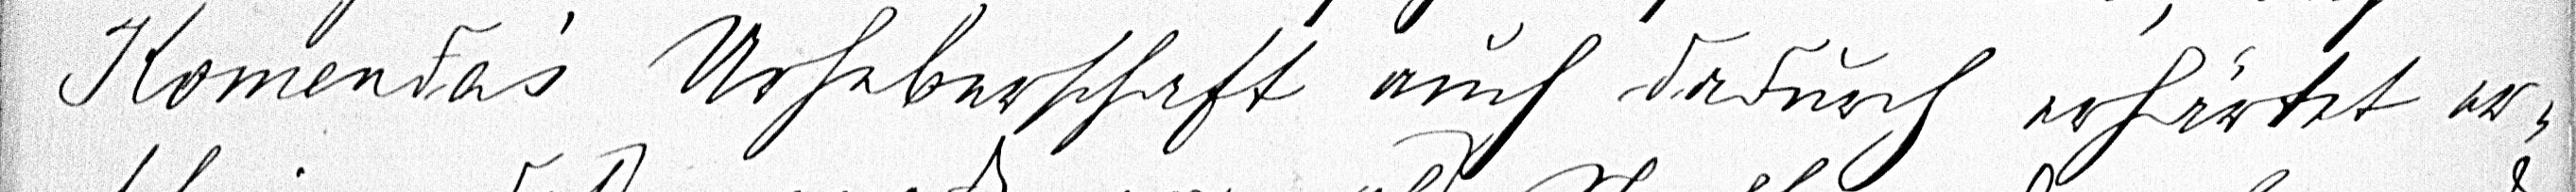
Komendás Urheberschaft auch dadurch erhärtet er¬
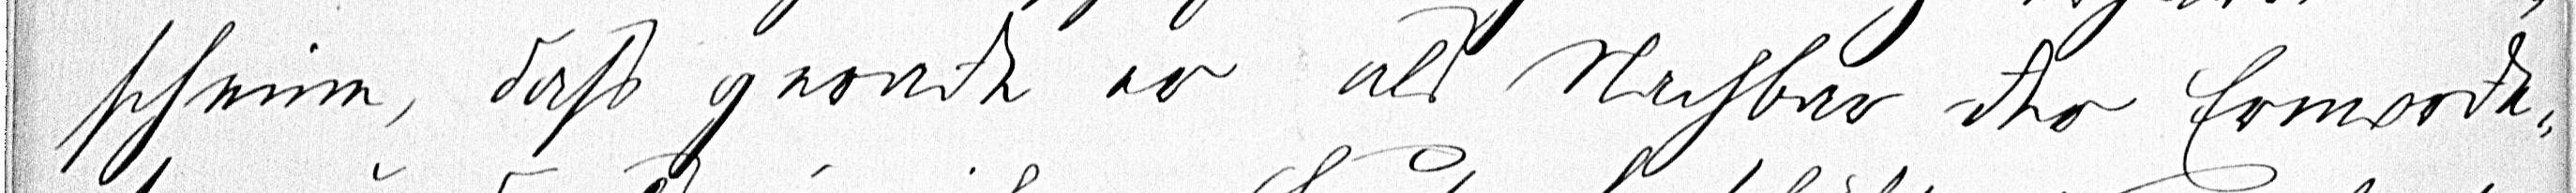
scheine, daß gerade er als Nachbar der Ermorde¬
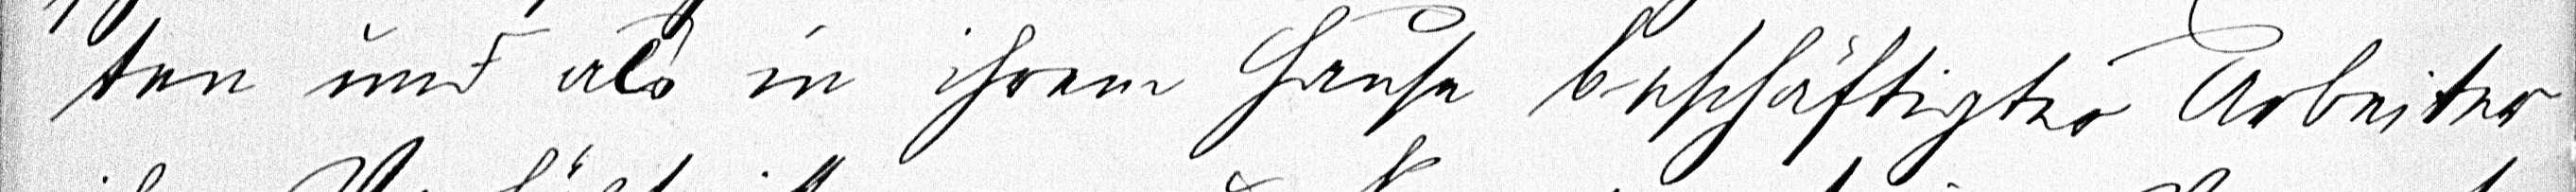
ten und als in ihrem Hause beschäftigter Arbeiter
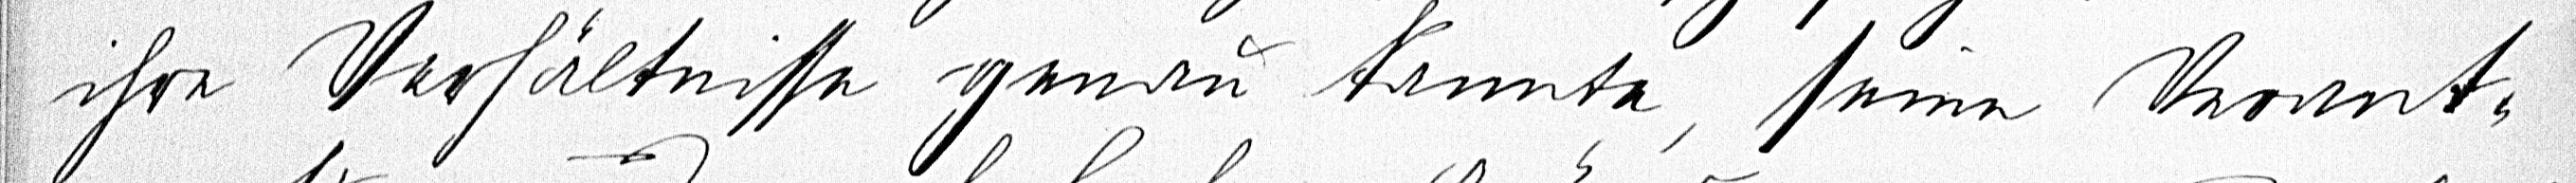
ihre Verhältnisse genau kannte, seine Verant¬
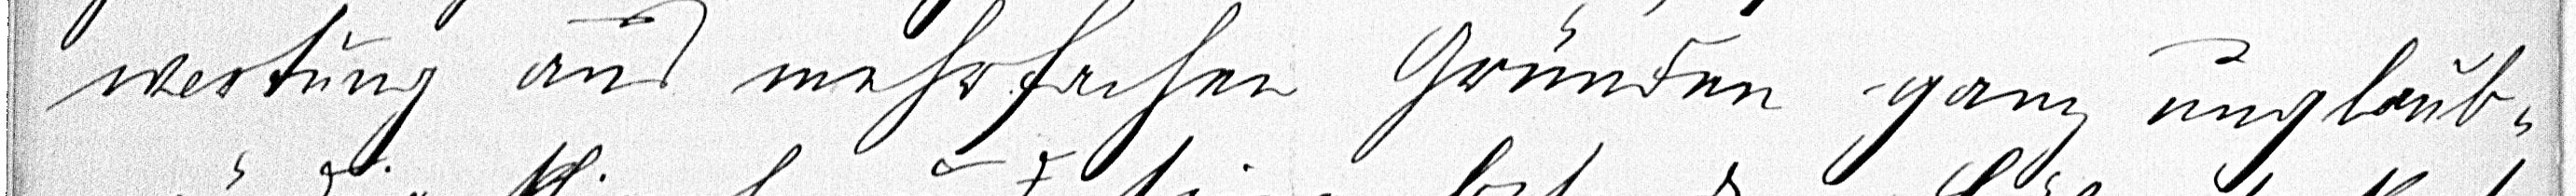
wortung aus mehrfachen Gründen ganz unglaub¬
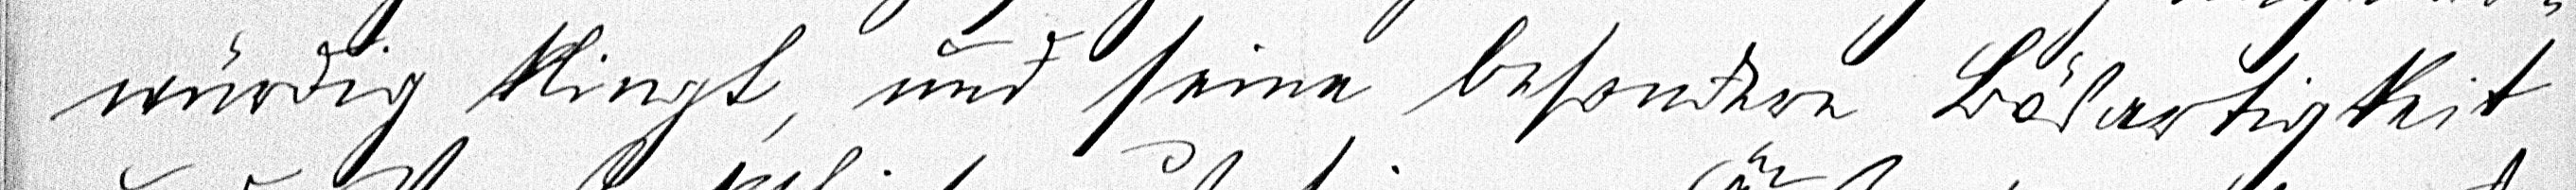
würdig liegt, und seine besondere Bösartigkeit
